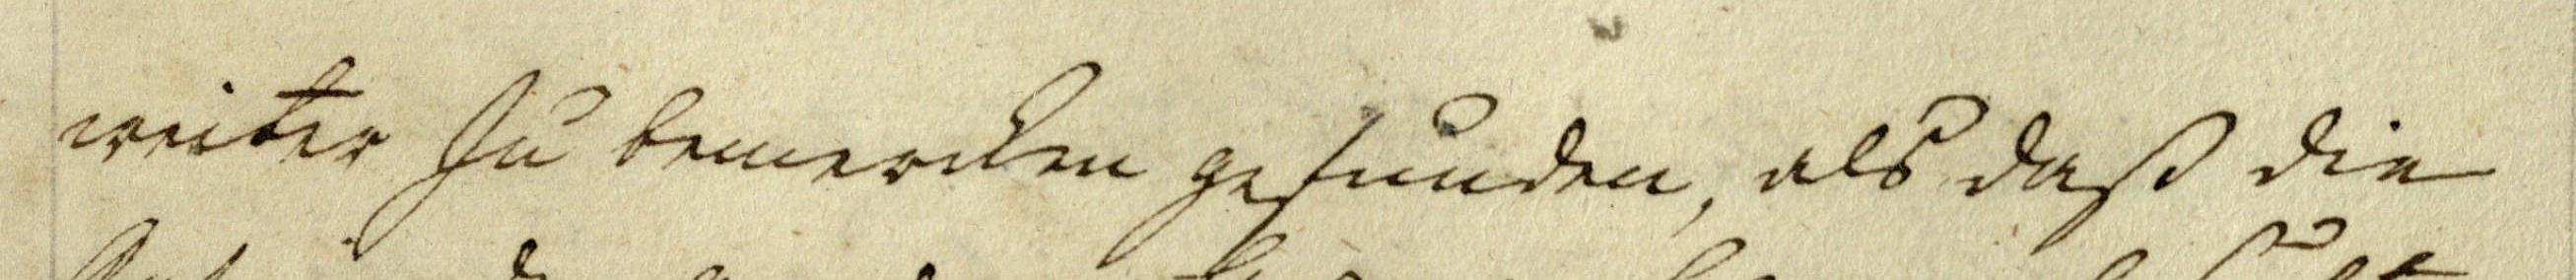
weiter zu bemercken gefunden, als daß die
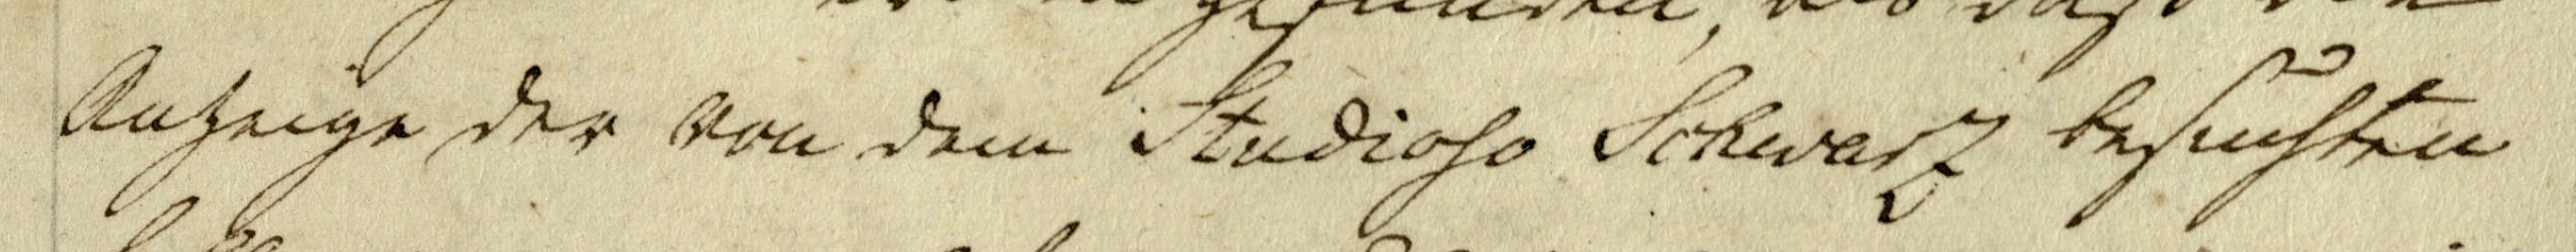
Anzeige der von dem Studioso Schwarz besuchten
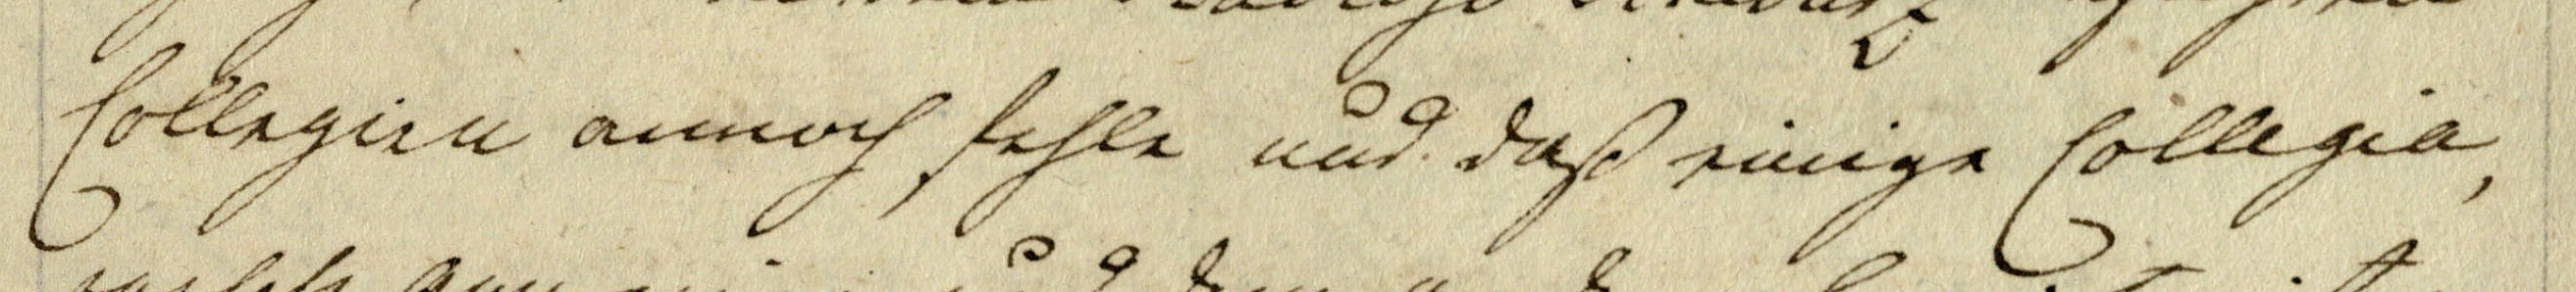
Collegien annoch fehle und daß einige Collegia,
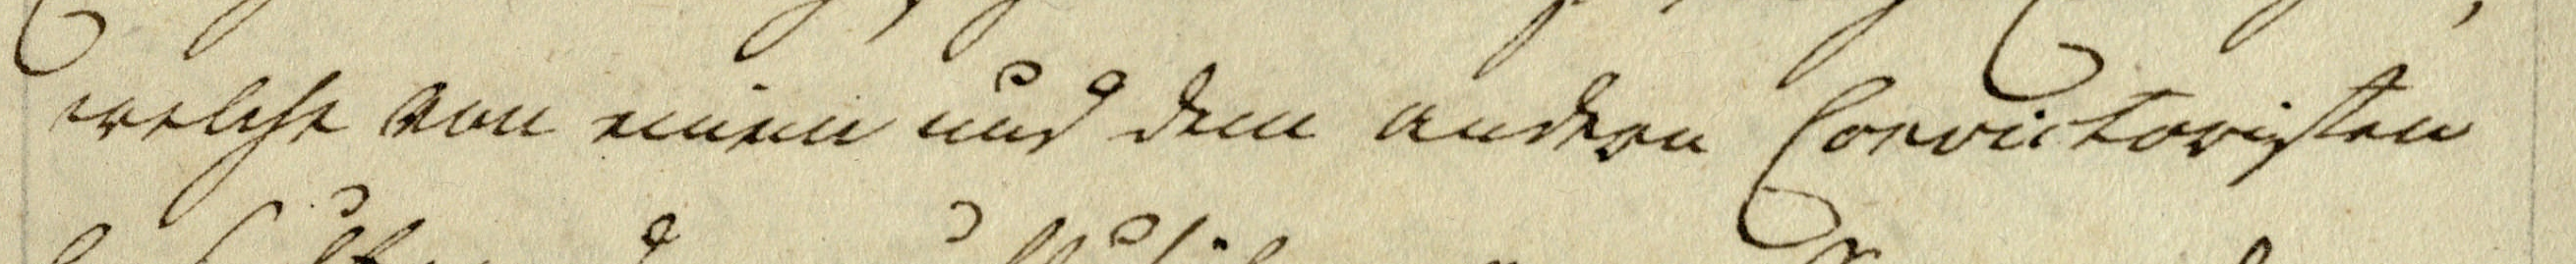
welche von einem und dem andern Convictoristen
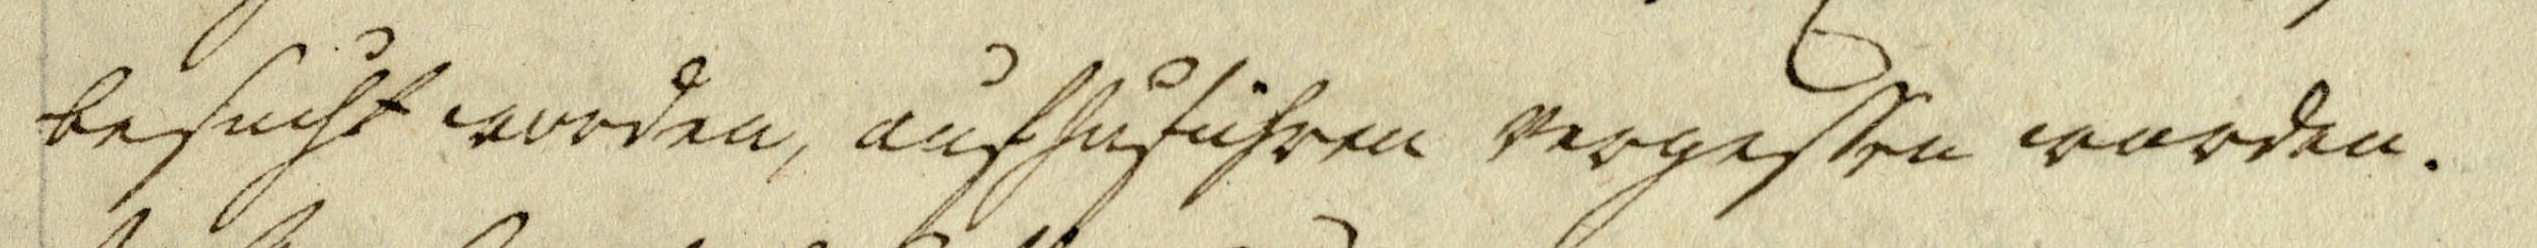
besucht worden, aufzuführen vergessen worden.
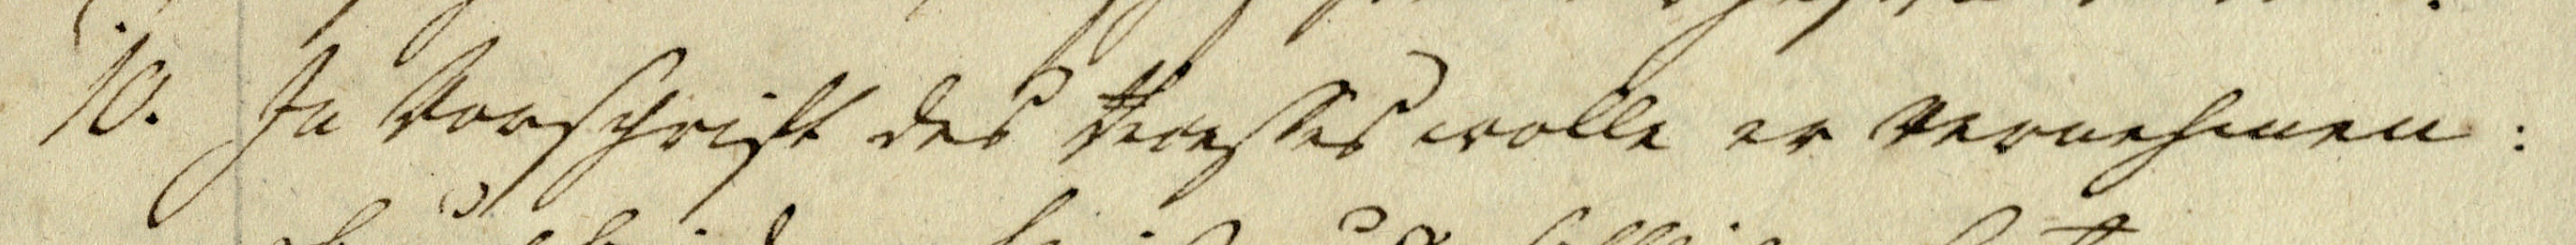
10. In Vorschrift des Recesses wolle er vernehmen:
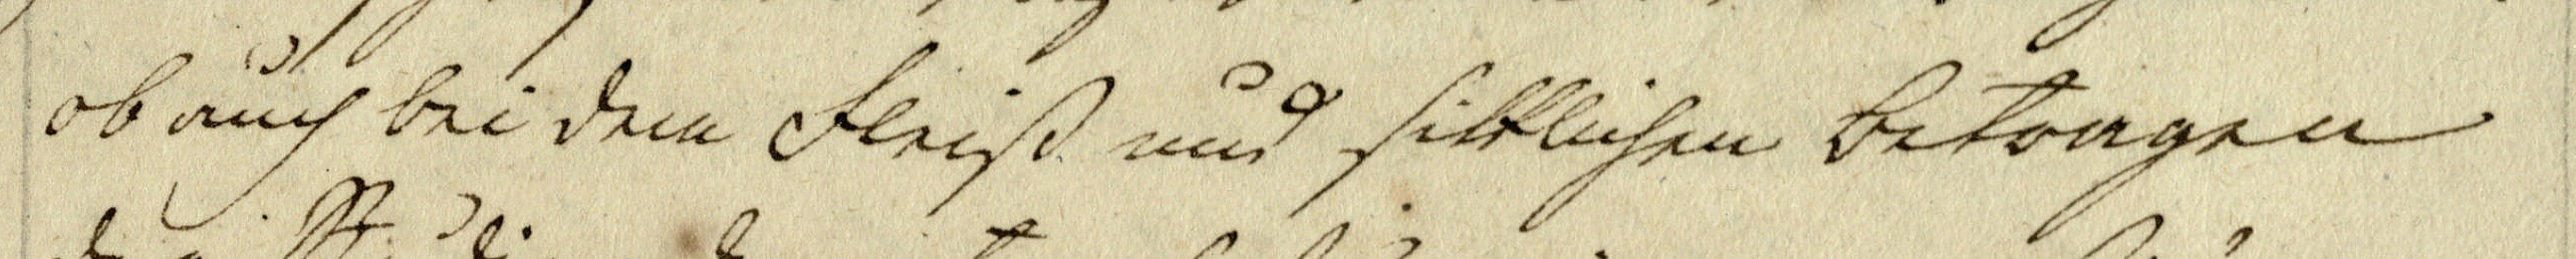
ob auch bei dem Fleiß und sittlichen Betragen
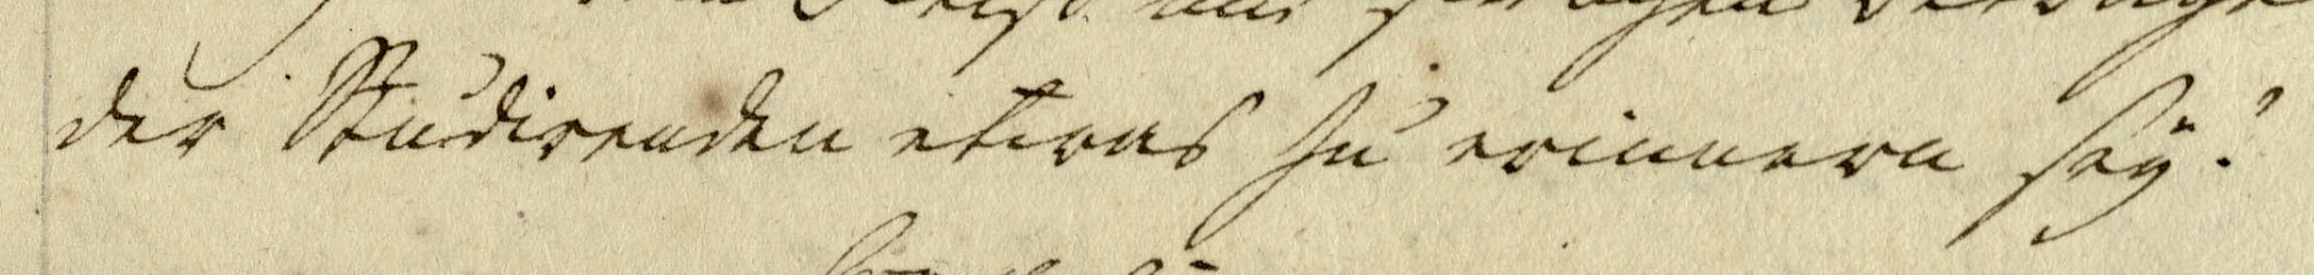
der Studirenden etwas zu erinnern seÿ?
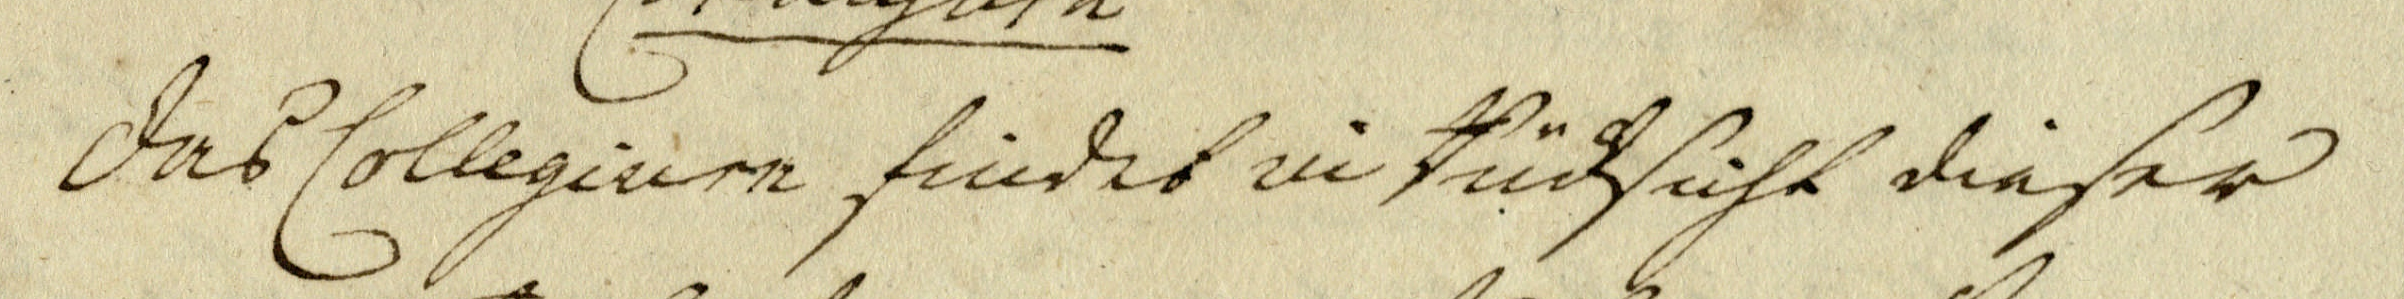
Das Collegium findet in Rücksicht dieser
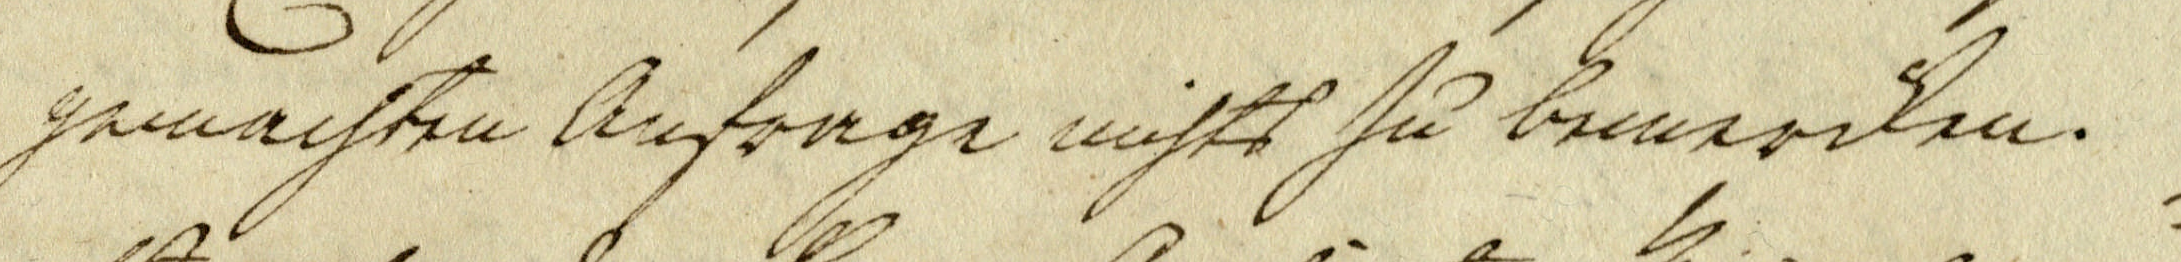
gemachten Anfrage nichts zu bemercken.
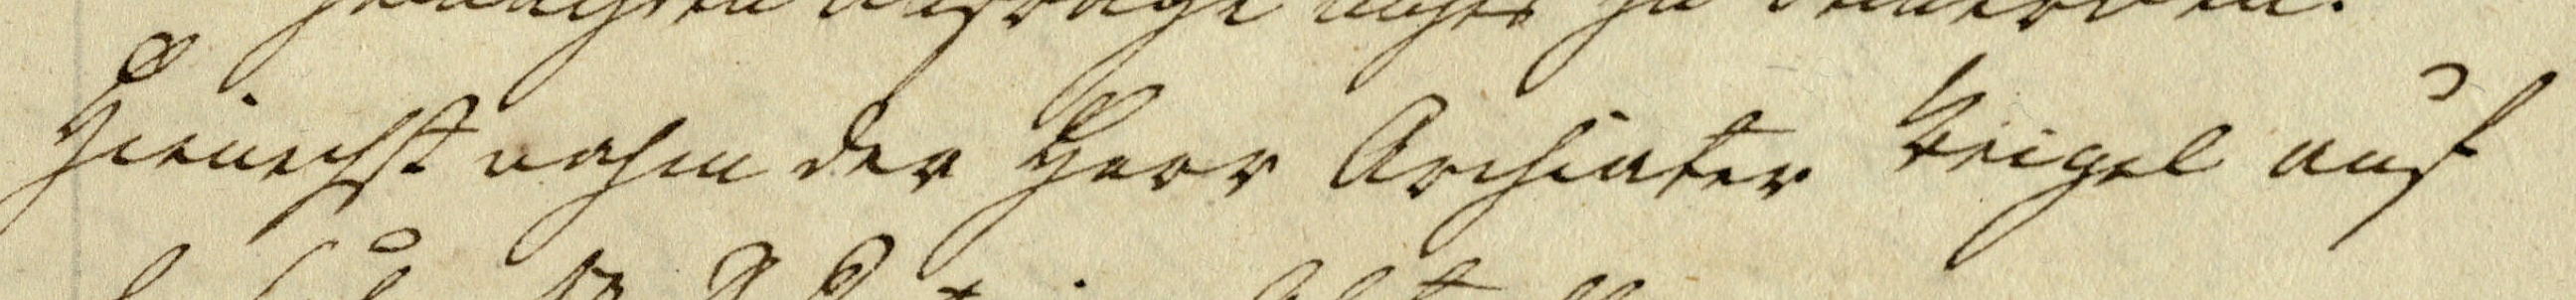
Hienechst nahm der Herr Archiater Weigel auf
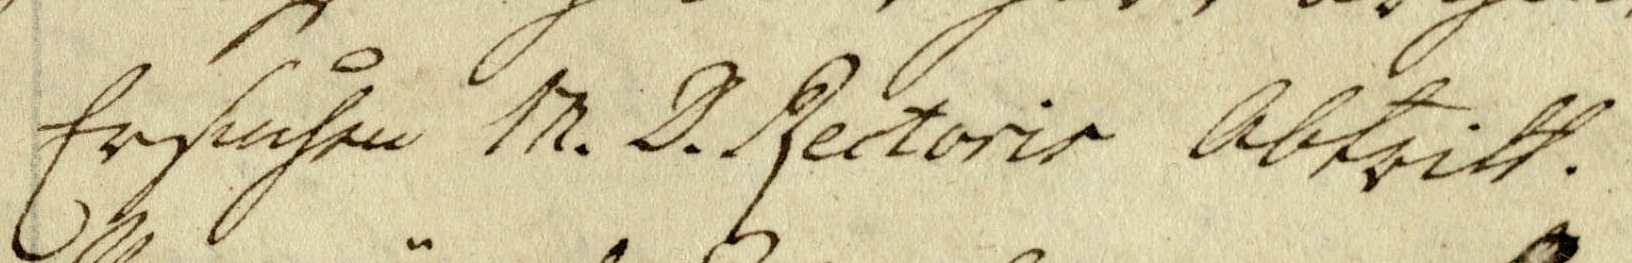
Ersuchen M. D. Rectoris Abtritt.
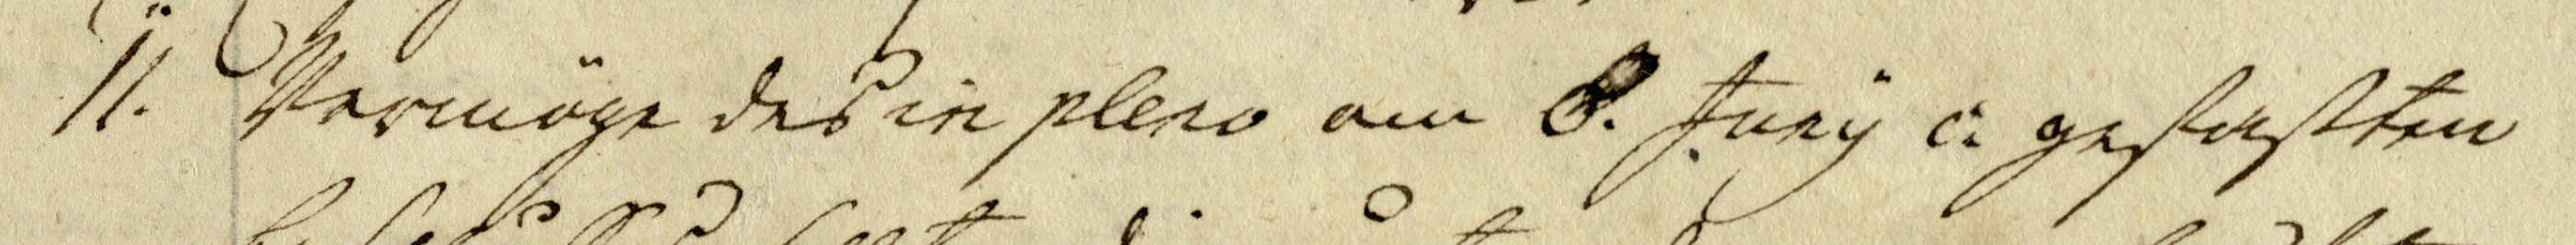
11. Vermöge des in pleno am 8. Junÿ c. gefaßten
